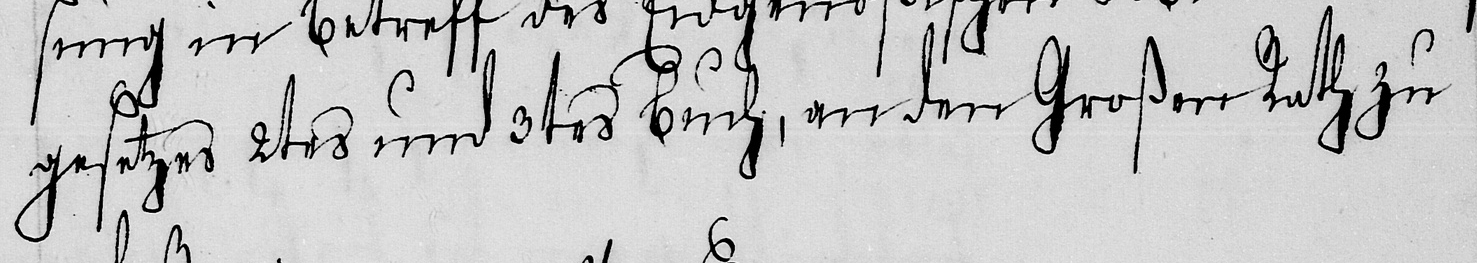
gesetzes 2tes und 3tes Buch, an den Großen Rath zu
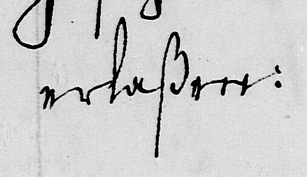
erlaßen:
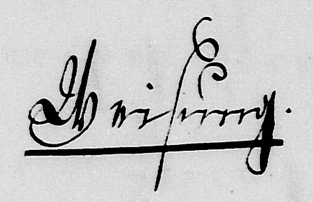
Weisung.
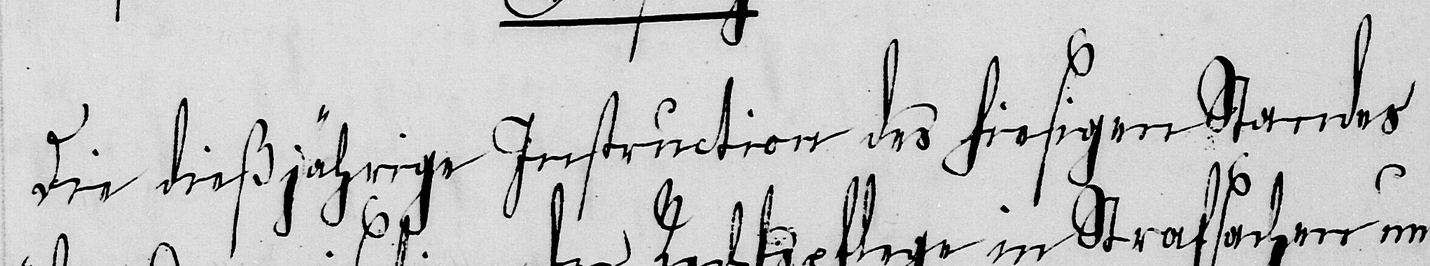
Die dießjährige Instruction des hiesigen Standes
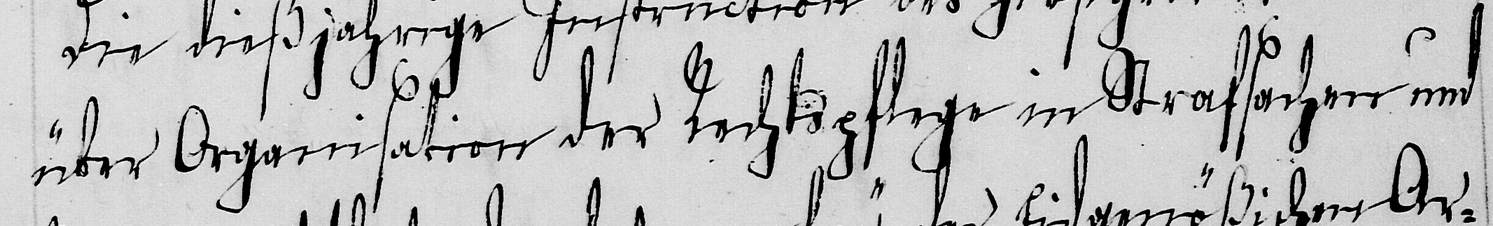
über Organisation der Rechtspflege in Strafsachen und
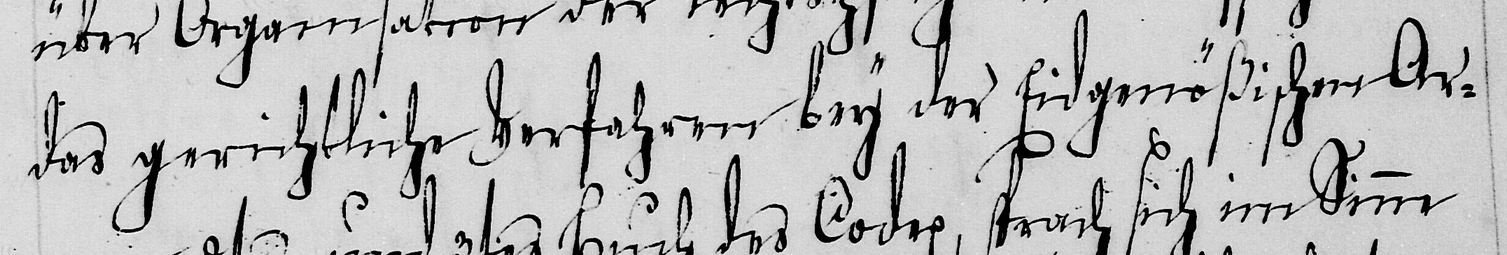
das gerichtliche Verfahren bey der Eidgenößischeen Ar¬
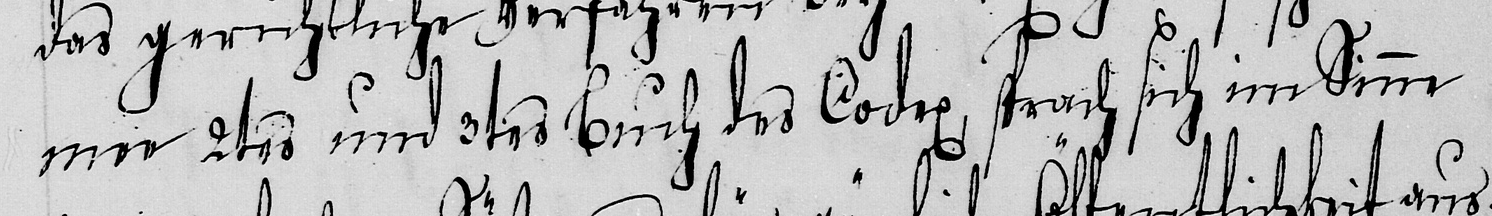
mee 2tes und 3tes Buch des Codex, sprach sich im Sinne
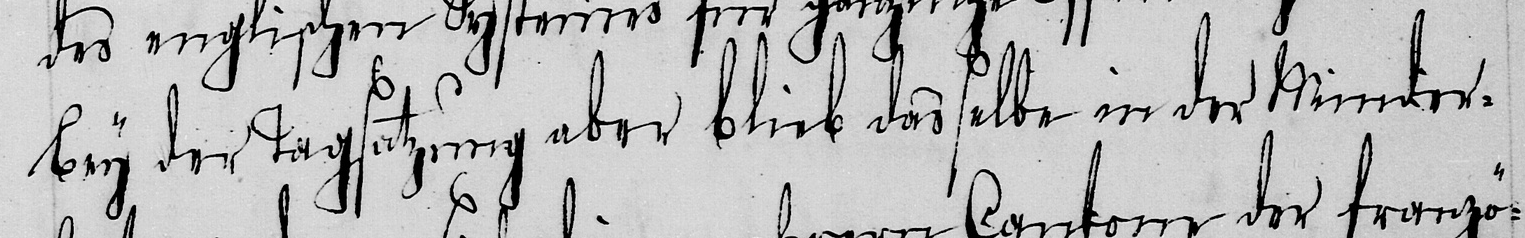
Bey der Tagsatzung aber blieb dasselbe in der Minder¬
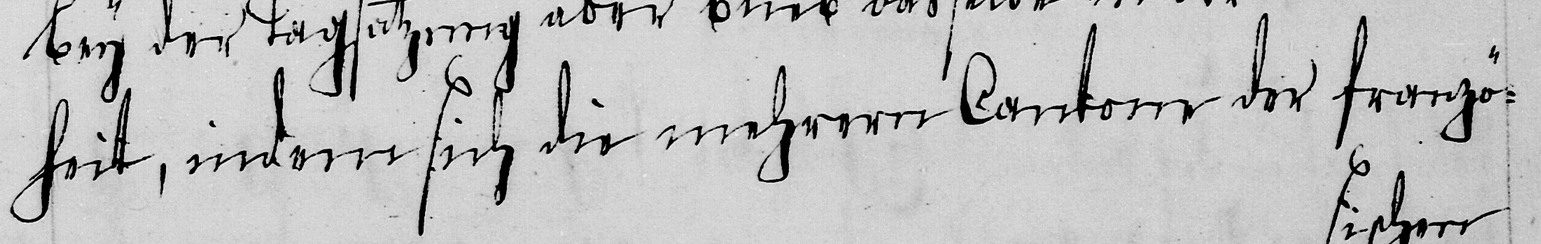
heit, indem sich die mehrern Cantone der franzö-
